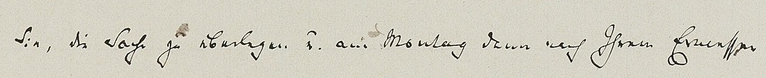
Sie, die Sache zu überlegen u. am Montag dann nach Ihrem Ermessen
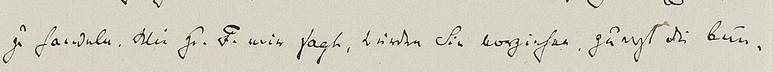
zu handeln. Wie Hr. F. mir sagte, würden Sie vorziehen zuerst die bun-
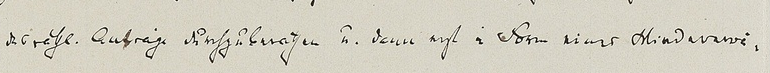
desräthl. Anträge durchzuberathen u. dann erst in Form eines Wiedererwä-
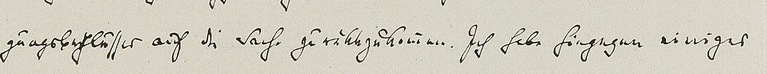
gungsbeschlusses auf die Sache zurükkzukommen. Ich habe hiegegen einiges
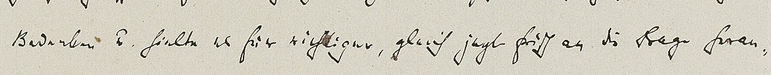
Bedenken u. hielte es für richtiger, gleich jezt frisch an die Frage heran-
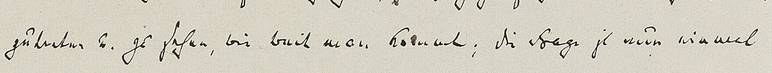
zutreten u. zu sehen, wie weit man kommt; die Frage ist nun einmal
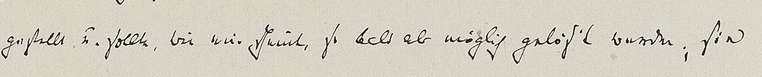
gestellt u. sollte, wie mir scheint, so bald als möglich gelöst werden; sie
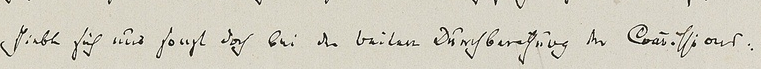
schiebt sich uns sonst doch bei der weitern Durchberathung der Commissions-
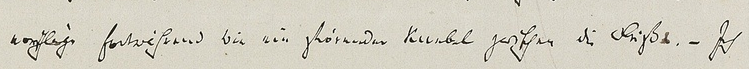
vorschläge fortwährend wie ein störender Knebel zwischen die Füße. – Ich
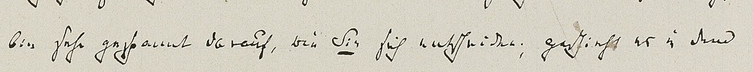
bin sehr gespannt darauf, wie Sie sich entscheiden; geschieht es in dem
